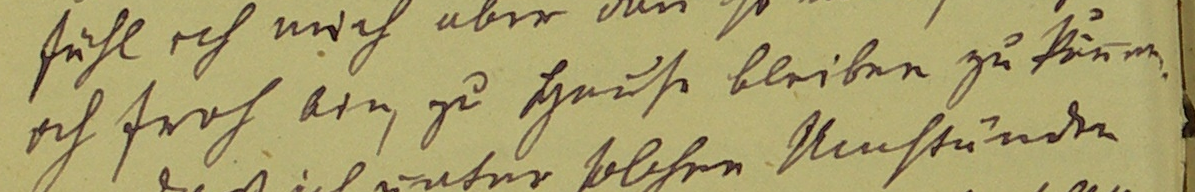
ich froh bin zu Hause bleiben zu können
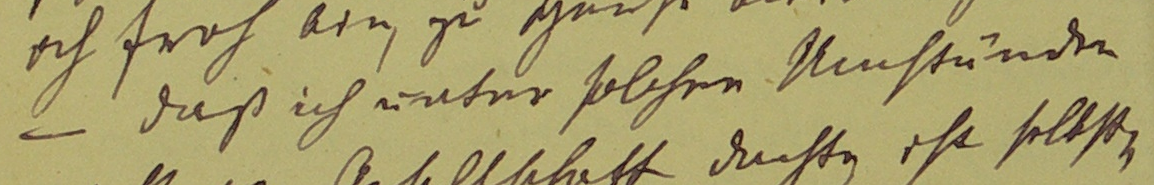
- daß ich unter solchen Umständen
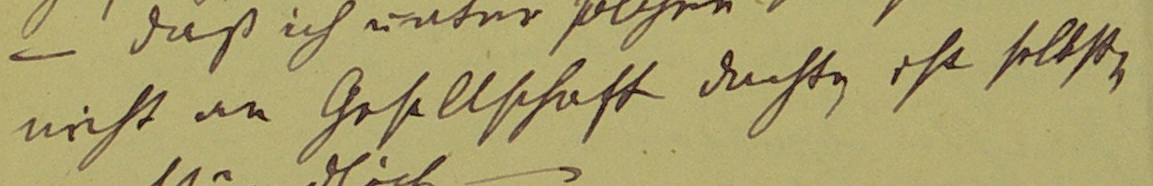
nicht an Gesellschaft dachte ist selbst¬
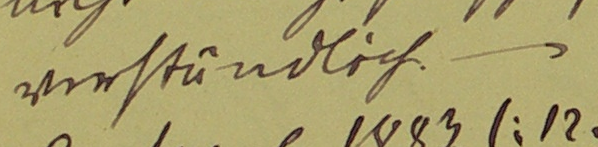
verständlich.—
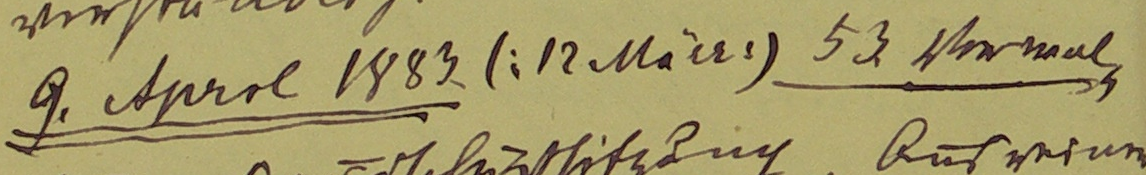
9. April 1883 (: 12 März :) 53. Verwal¬
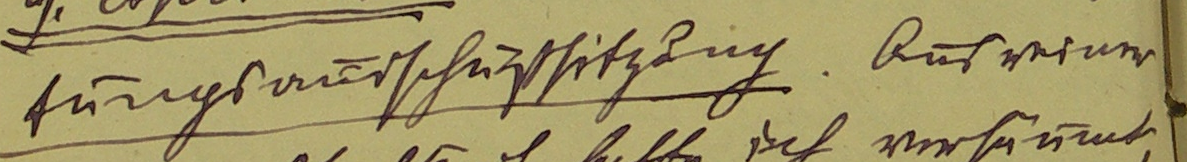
tungsausschutzsitzung. Aus meiner
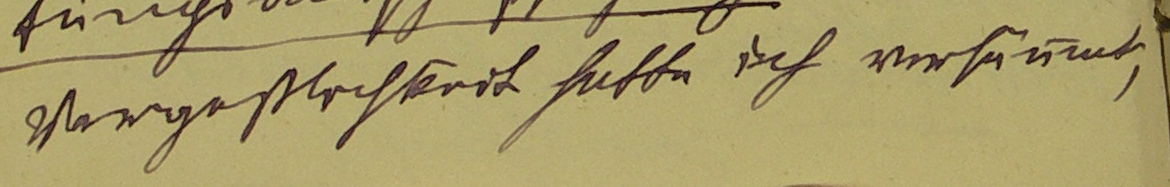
Vergeßlichkeit hatte ich vesäumt
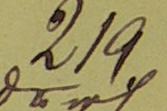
219
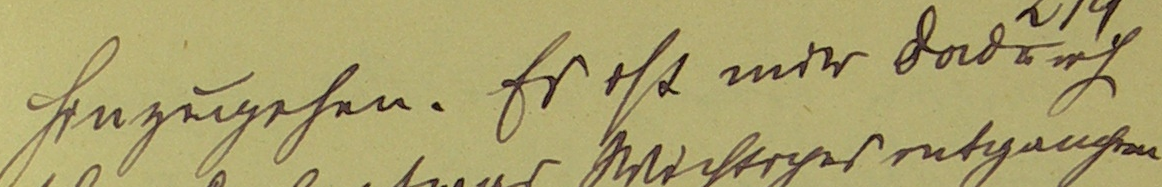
hinzugehen. Es ist mir dadurch
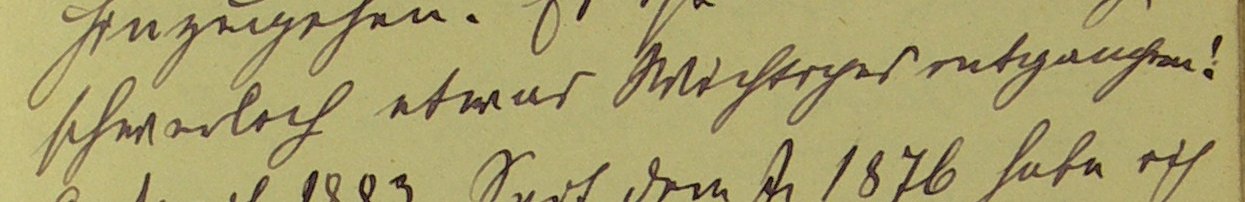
schwerlich etwas Wichtiges entgangen! -
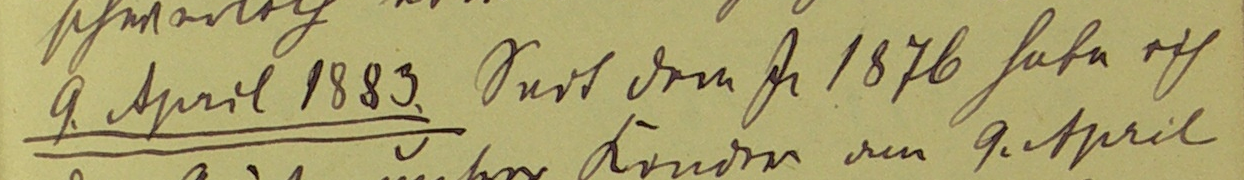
9. April 1883. Seit dem Januar 1876 habe
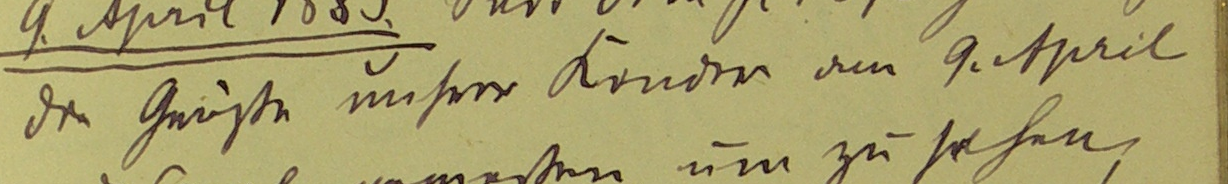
ich die Größe unserer Kinder am 9. April
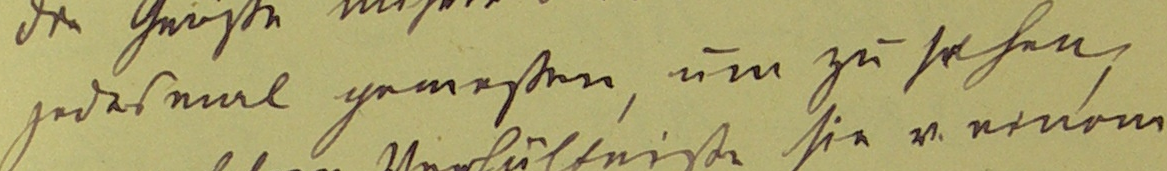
jedesmal gemeßen, um zu sehen
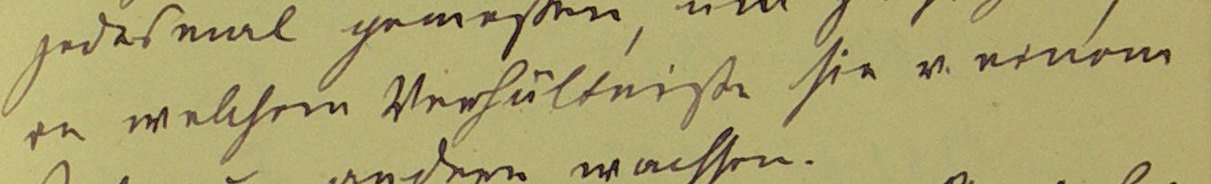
in welchem Verhälniße sie von einem
